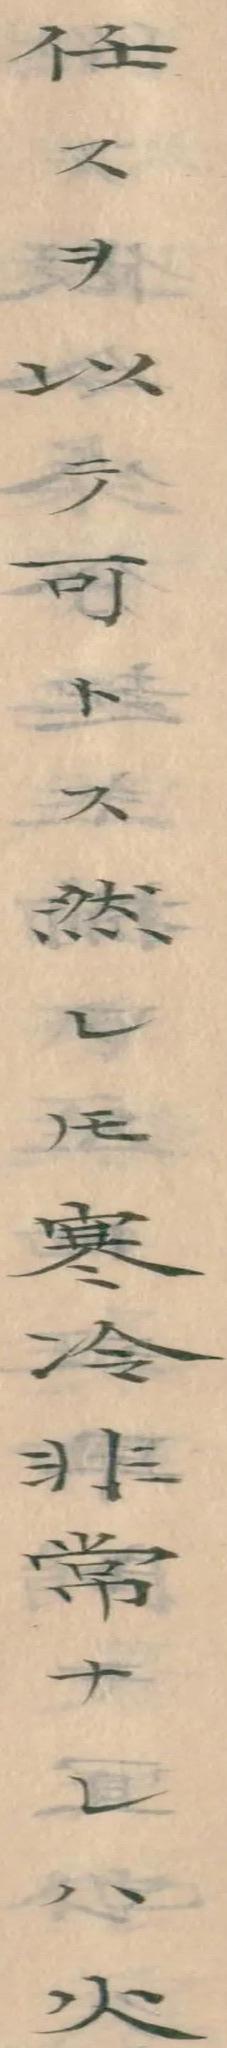任スヲ以テ可トス然レトモ寒冷非常ナレハ火
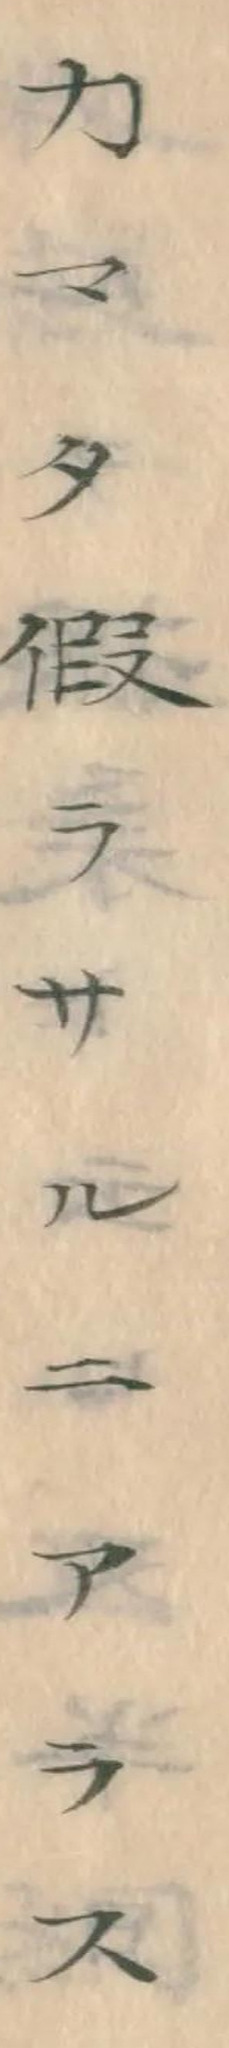力マタ仮ラサルニアラス
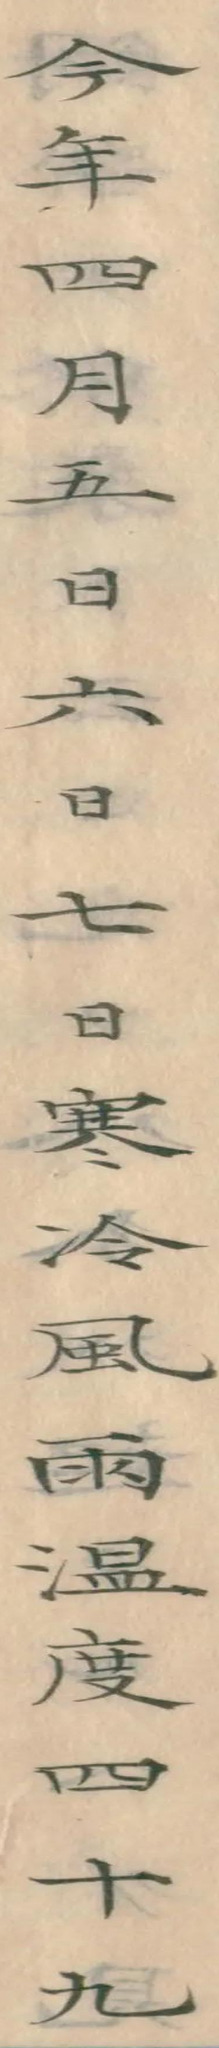今年四月五日六日七日寒冷風雨温度四十九
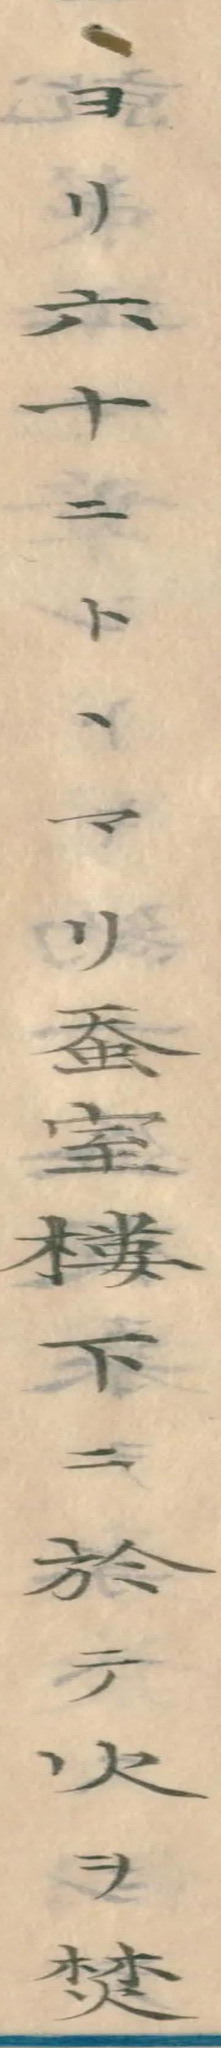ヨリ六十ニトヽマリ蚕室楼下ニ於テ火ヲ焚
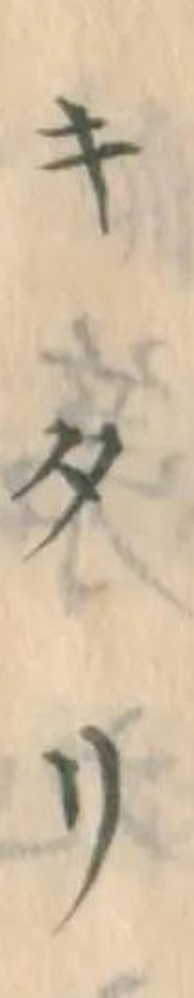キタリ
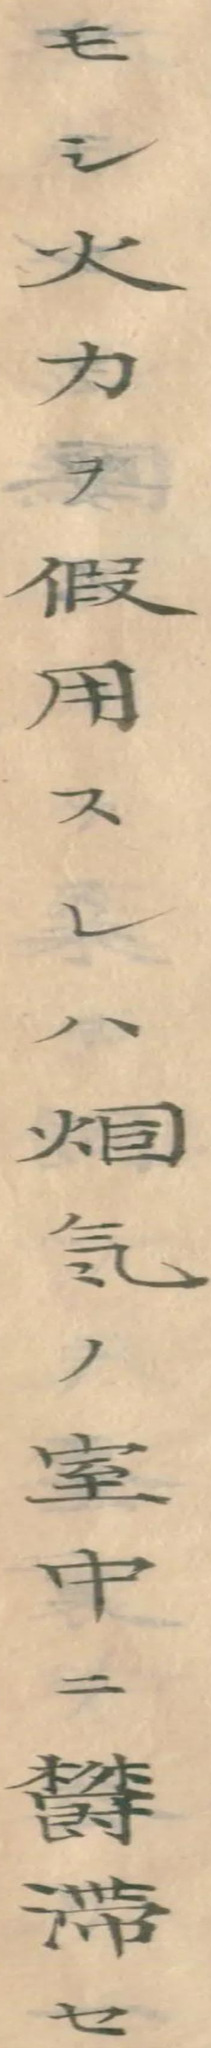モシ火力ヲ仮用スレハ𤇆気ノ室中ニ欝滞セ

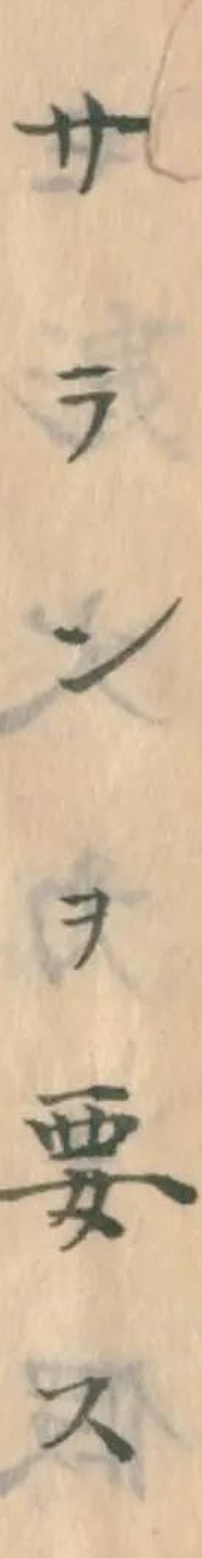サランヲ要ス
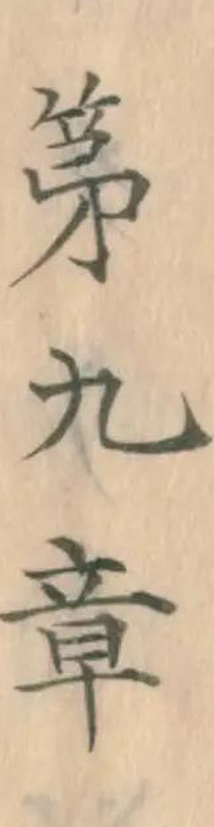第九章
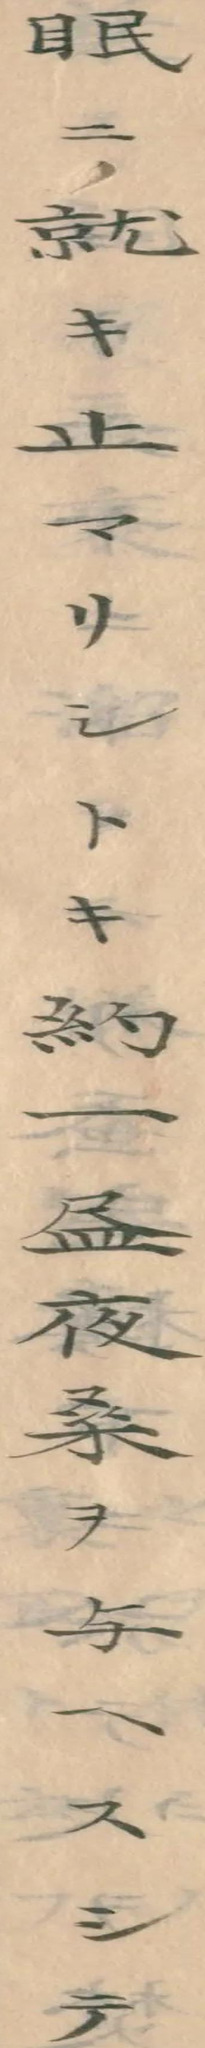眠ニ就キ止マリシトキ約一昼夜桑ヲ与ヘスシテ
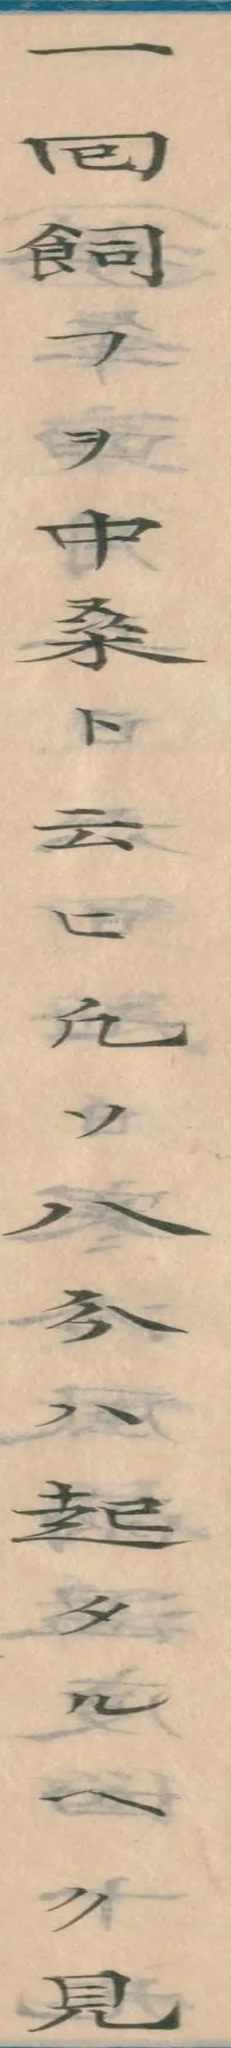一回飼フヲ中桑ト云ヒ凡ソ八分ハ起タルヘク見
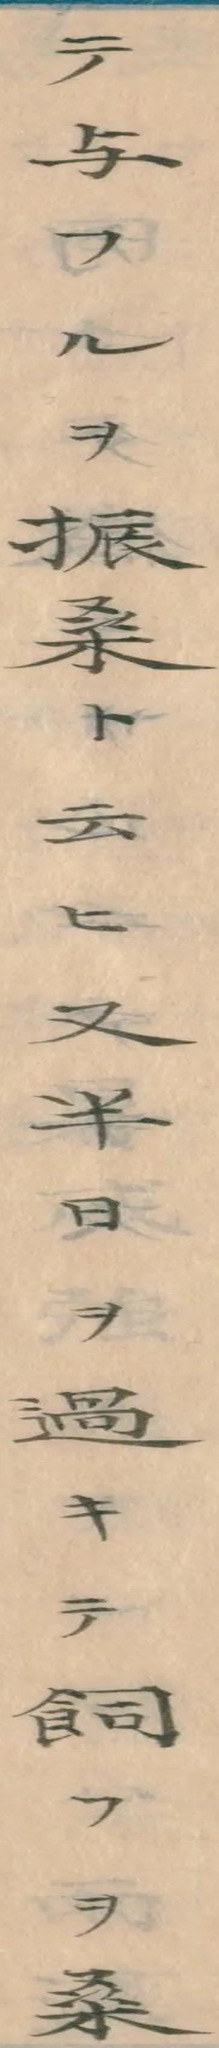テ与フルヲ振桑ト云ヒ又半日ヲ過キテ飼フヲ桑
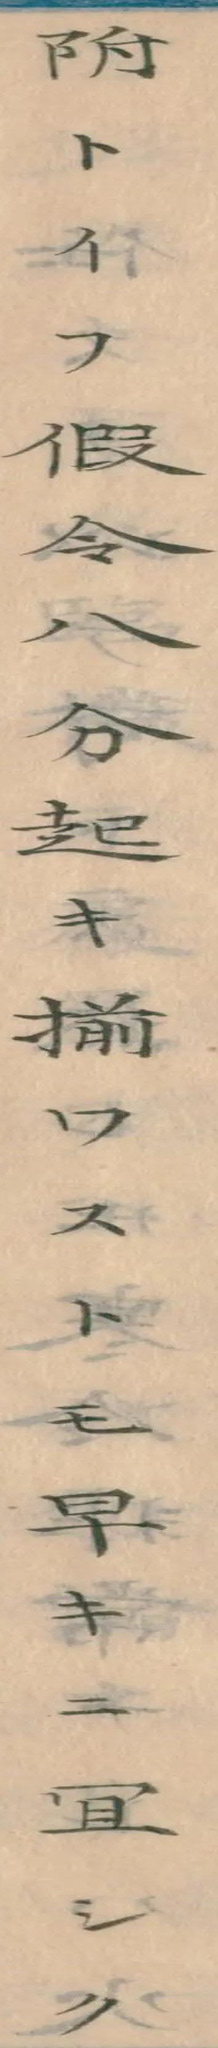附トイフ仮令八分起キ揃ワストモ早キニ宜シク
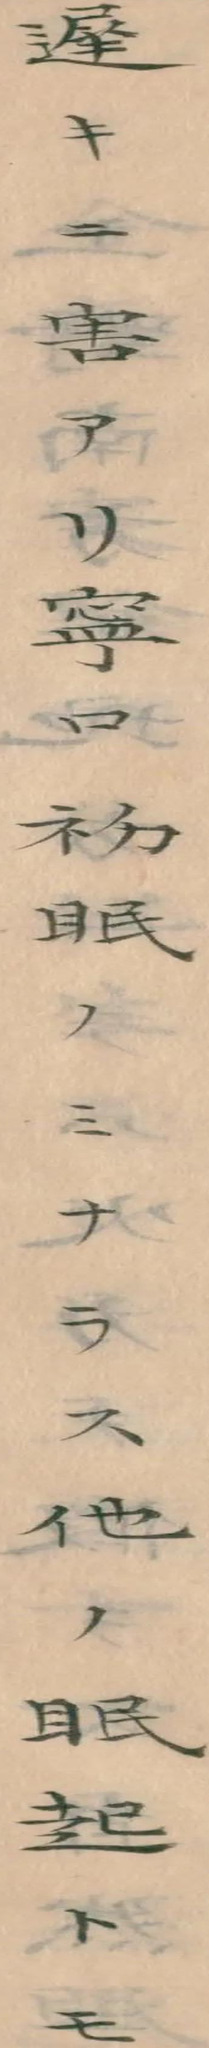遅キニ害アリ寧ロ初眠ノミナラス他ノ眠起トモ
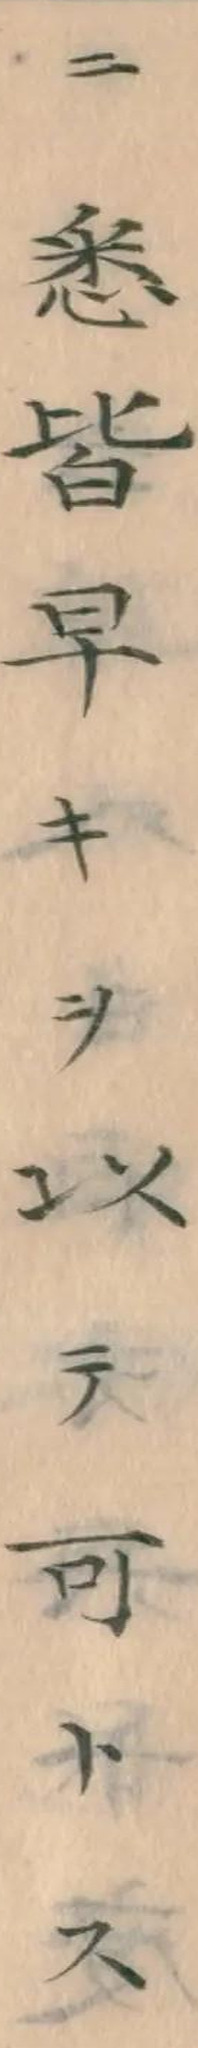ニ悉皆早キヲ以テ可トス
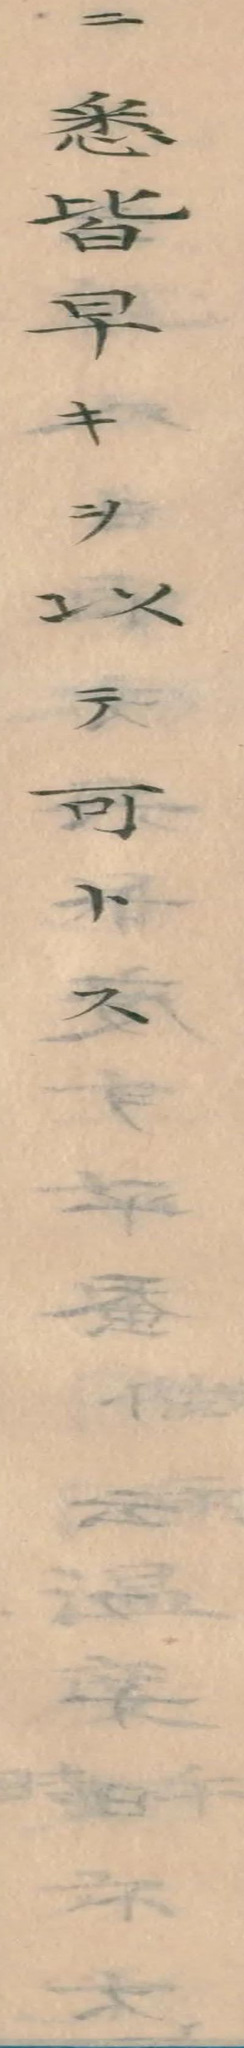ニ悉皆早キヲ以テ可トス
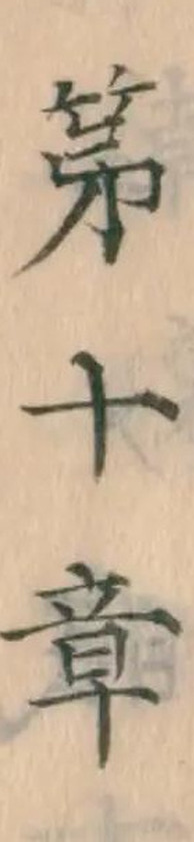第十章
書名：蚕桑集成
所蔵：国立国会図書館 National Diet Library, JAPAN
